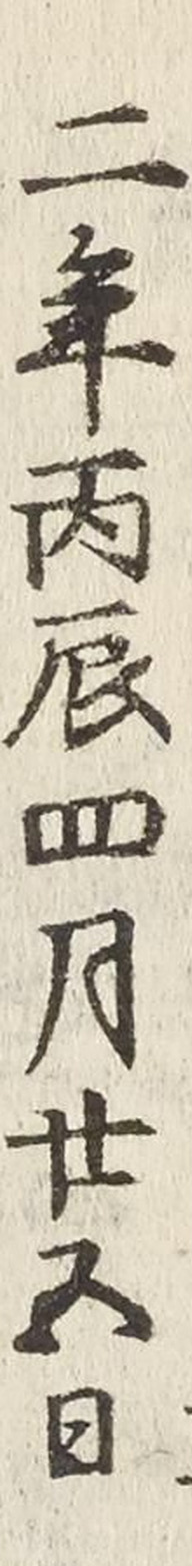二年丙辰四月廿五月
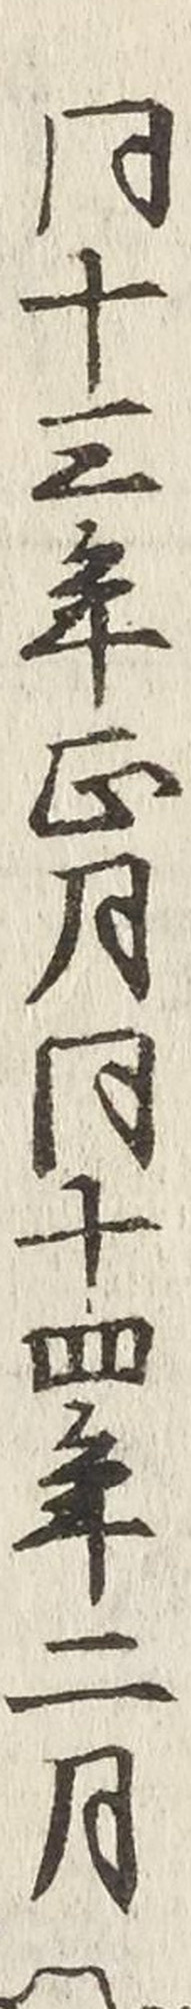同十三年正月同十四年二月
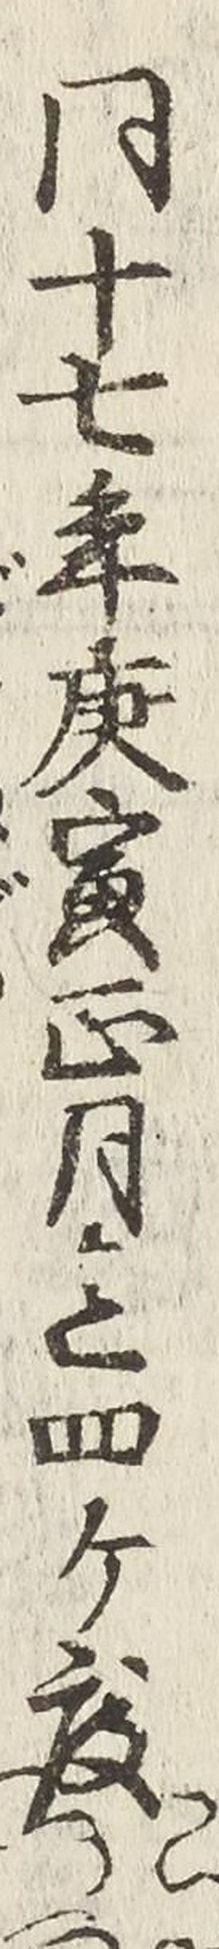同十七年庚寅正月迄四ヶ度

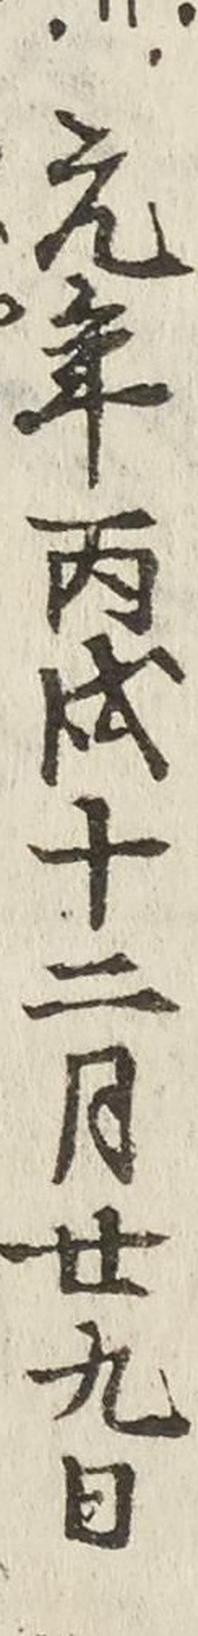元年丙戌十二月廿九日
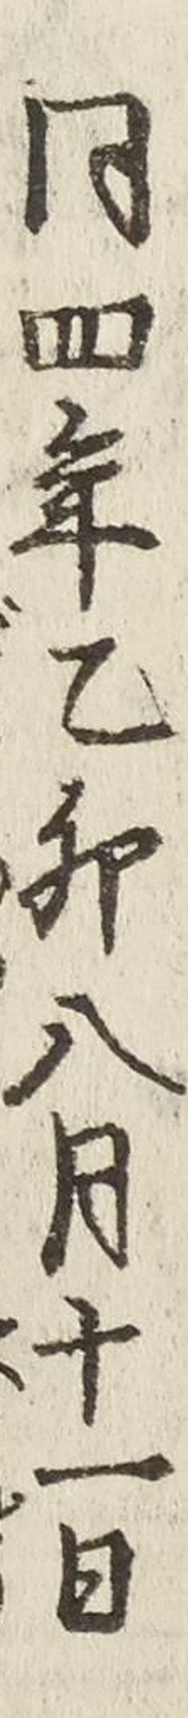同四年乙卯八月十一日
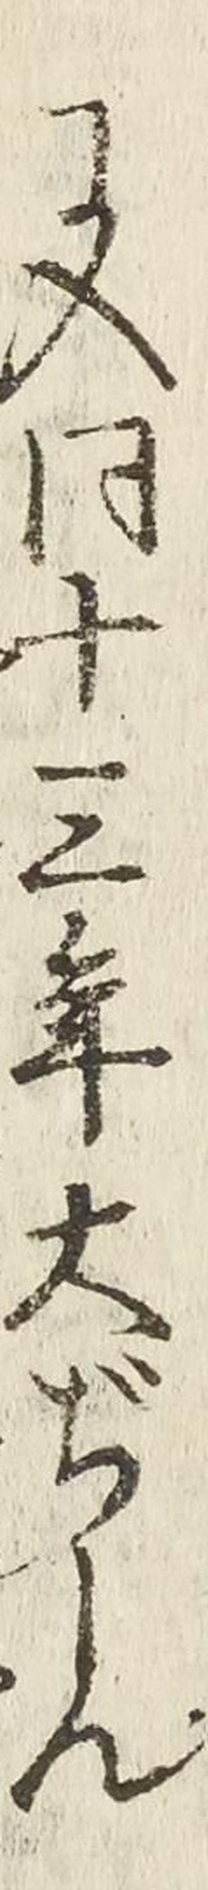に入同十三年大ぢしん

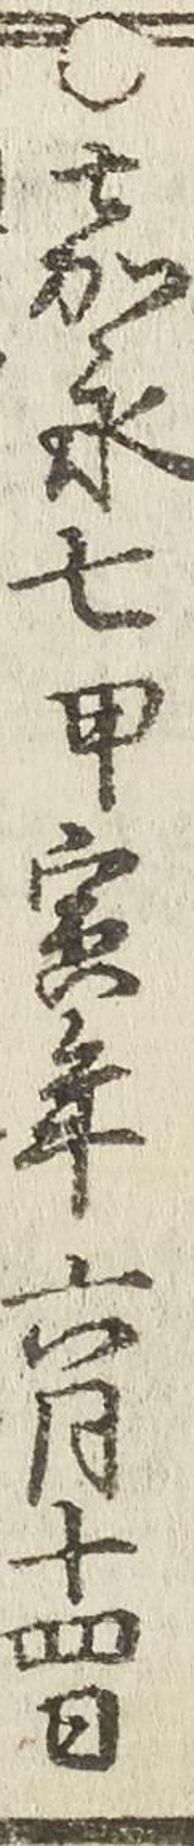○嘉永七甲寅年六月十四日

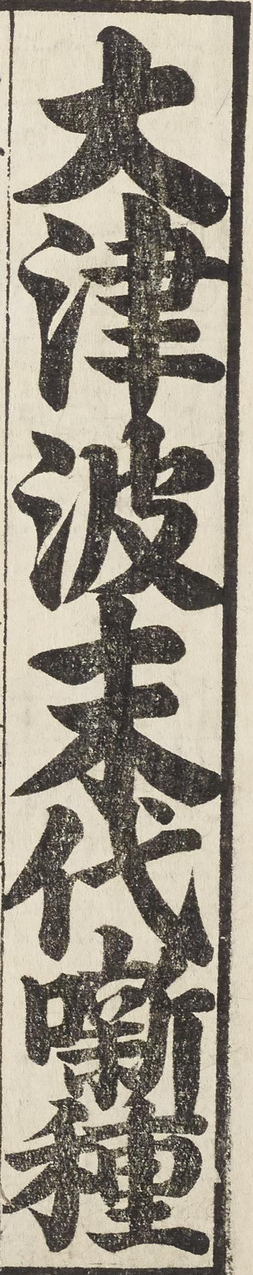大津波末代噺種
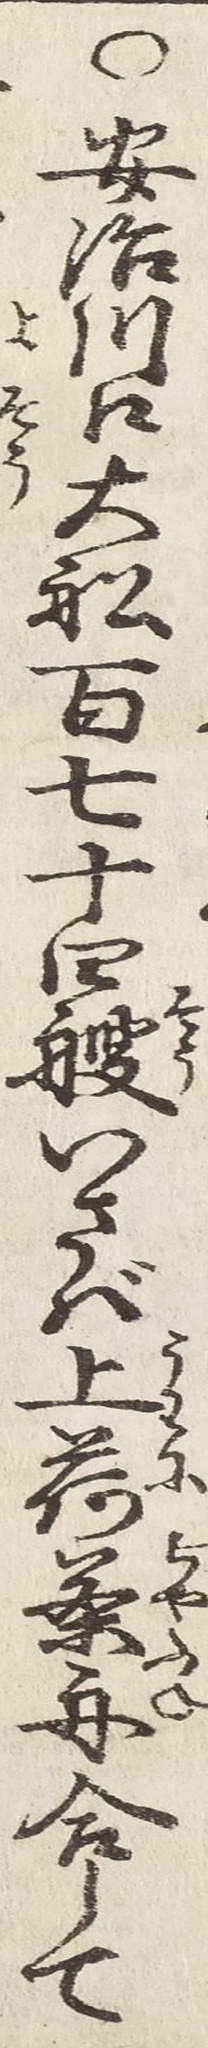○木津川口大船五百九十艘いさば上荷茶舟合して
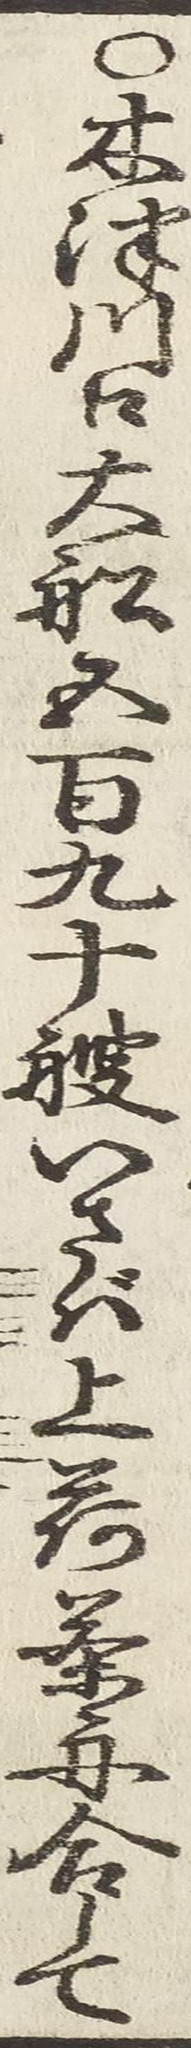○木津川口大船五百九十艘いさば上荷茶舟合して
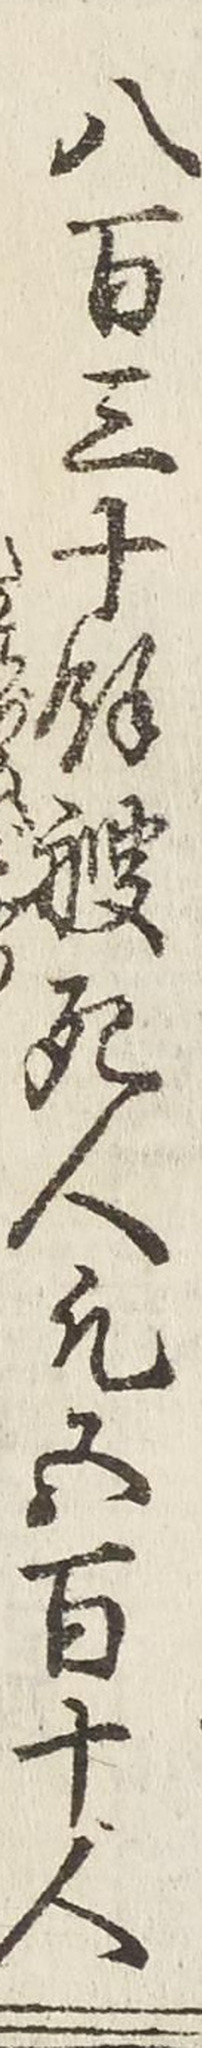八百三十余艘死人凡五百十人
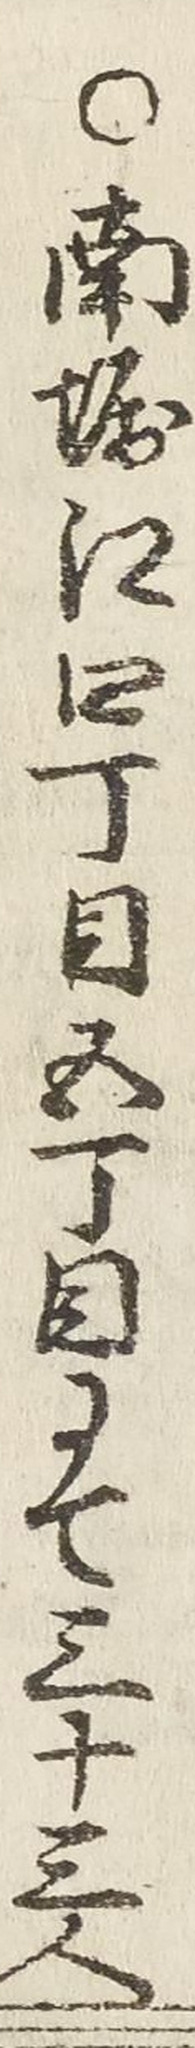○南堀江四丁目五丁目にて三十三人
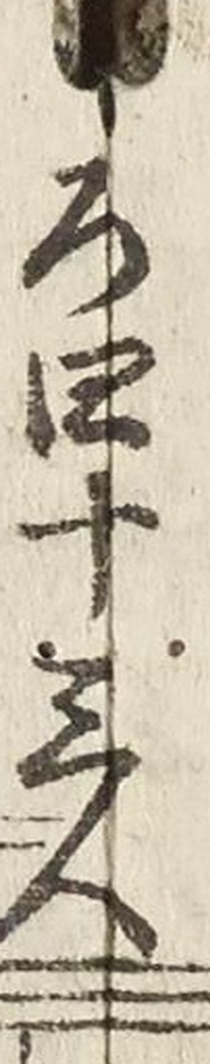○よろ四十三人
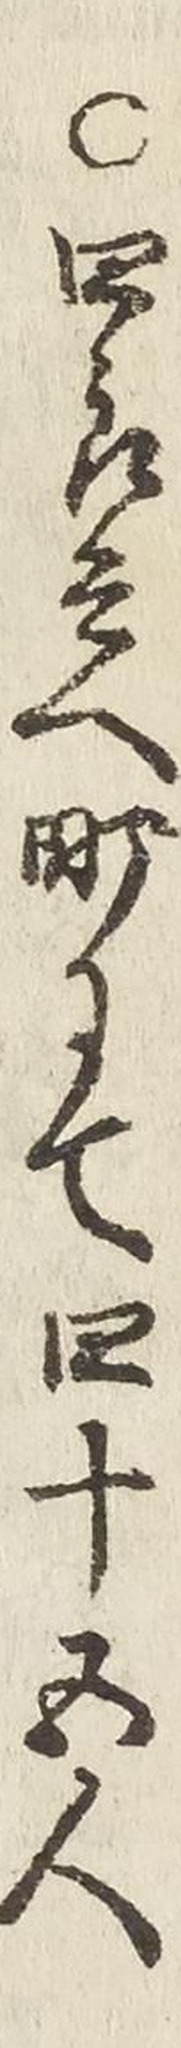○四郎兵へ町にて四十五人
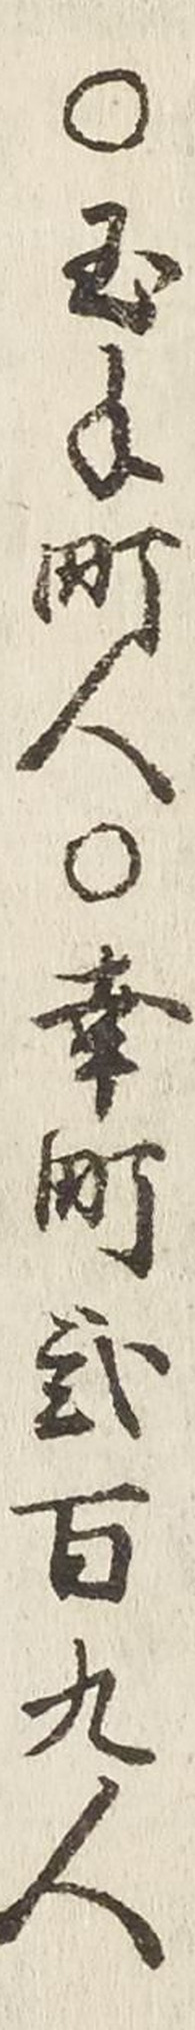○玉手町人○幸町弐百九人
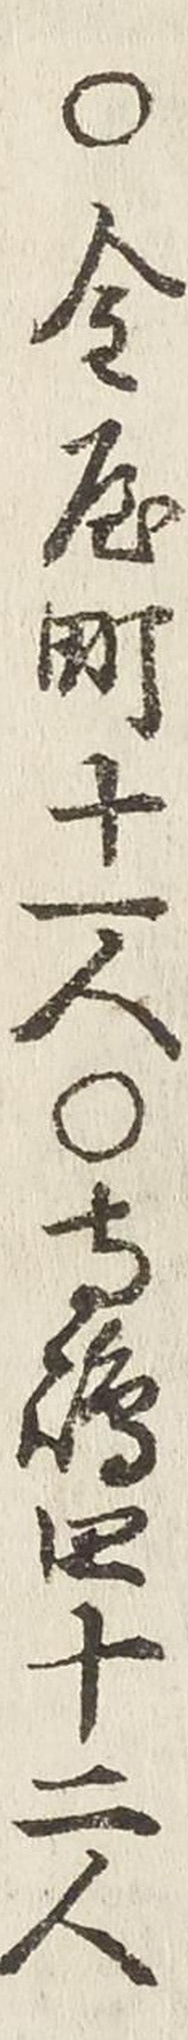○金屋町十一人○寺嶋四十二人
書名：大地震大（津浪）末代噺（の）種　三編全
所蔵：東京大学地震研究所図書室 Earthquake Research Institute Library, The University of Tokyo, JAPAN
